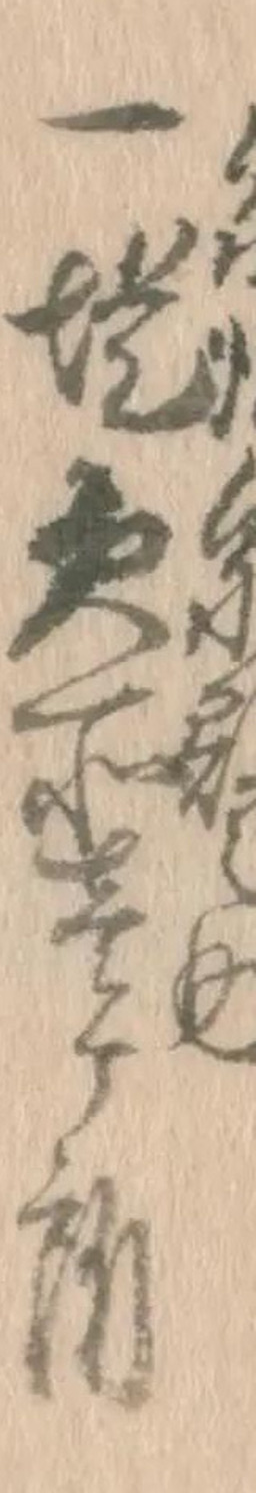一堤欠所壱ヶ所
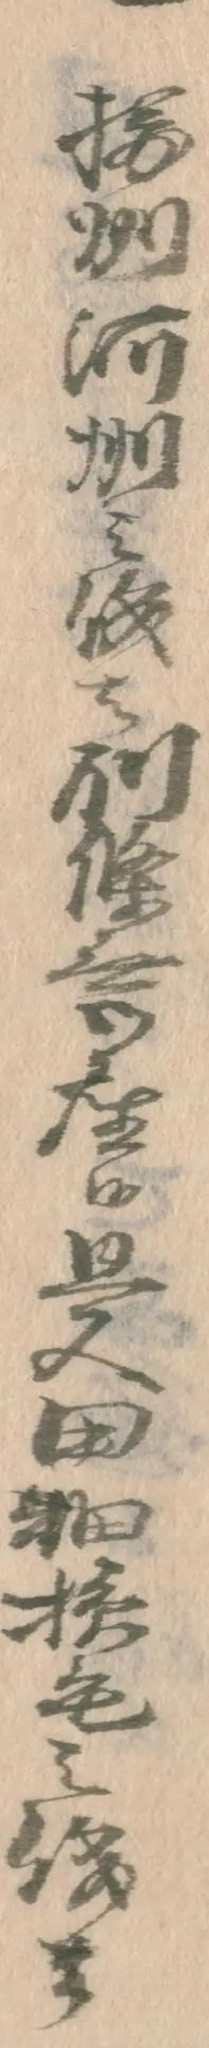一播州阿州之儀者別条無御座候且又田畑損毛之儀者
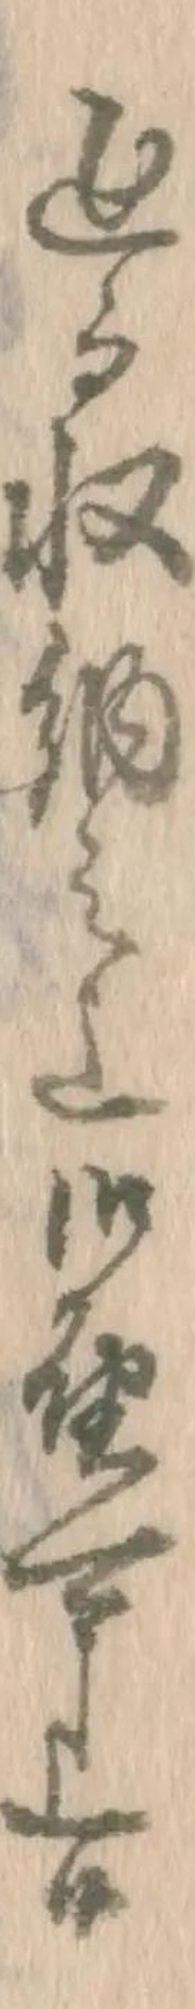追而収納之上御届可申上候
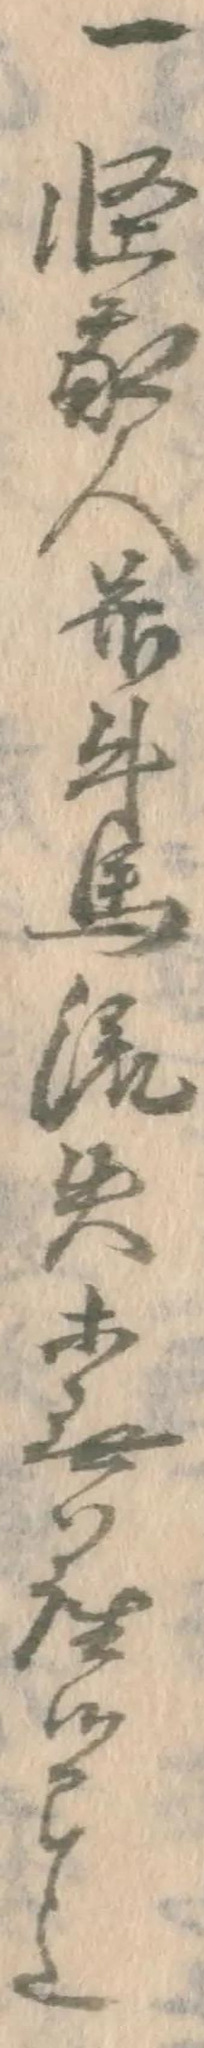一怪我人并牛馬流失等無御座候
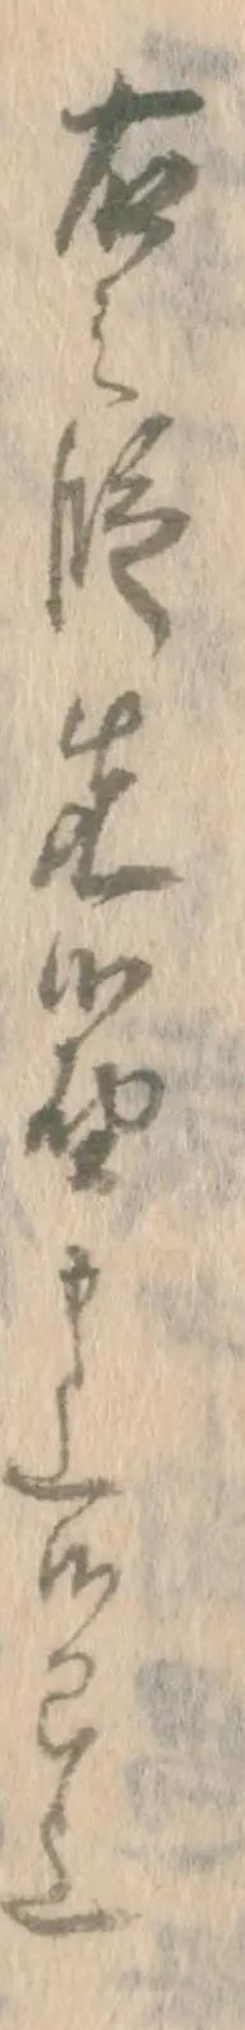右之段先御届申上候已上
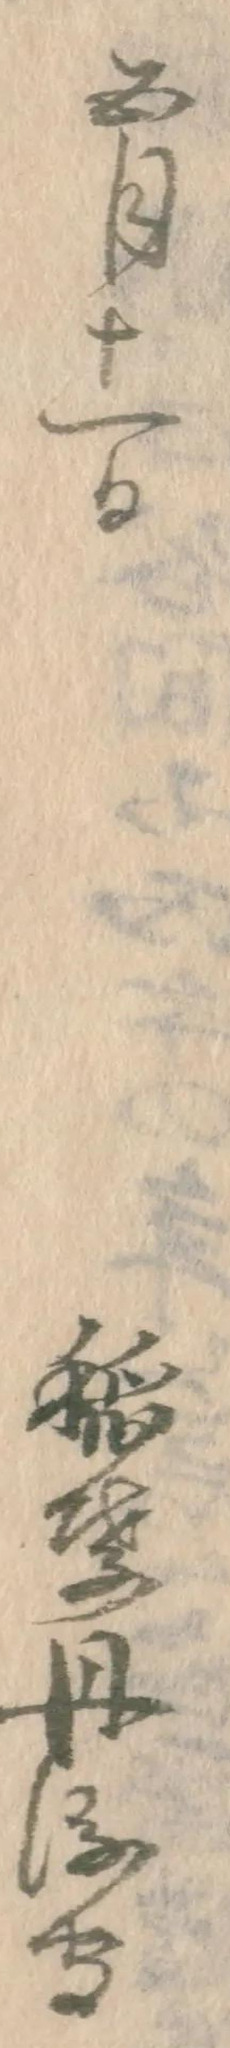五月十一日稲葉丹後守

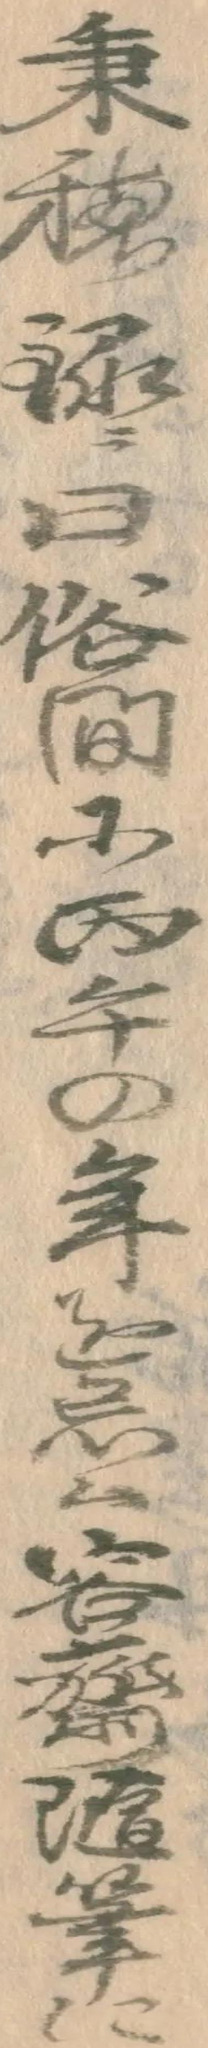兼穂録二曰俗間に丙午の年を忌ムハ容斎随筆に
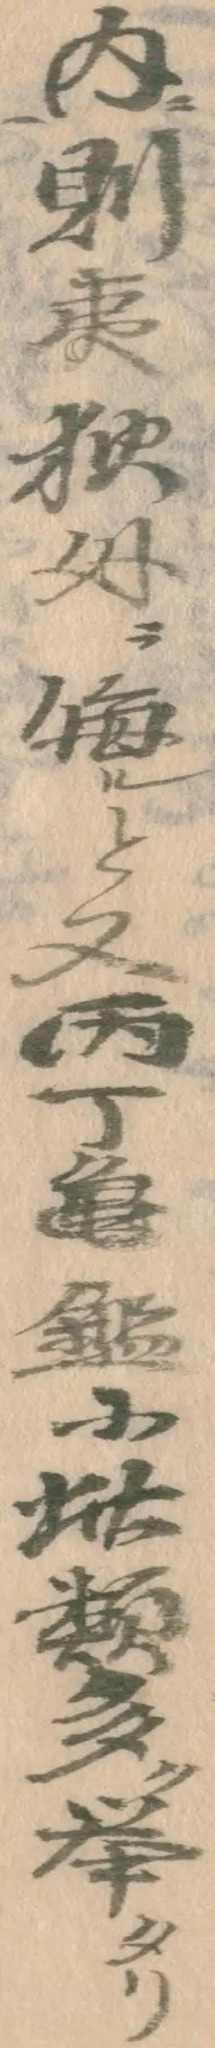内則夷独外二侮ㇽと又丙丁亀鑑に此類多ク挙タリ
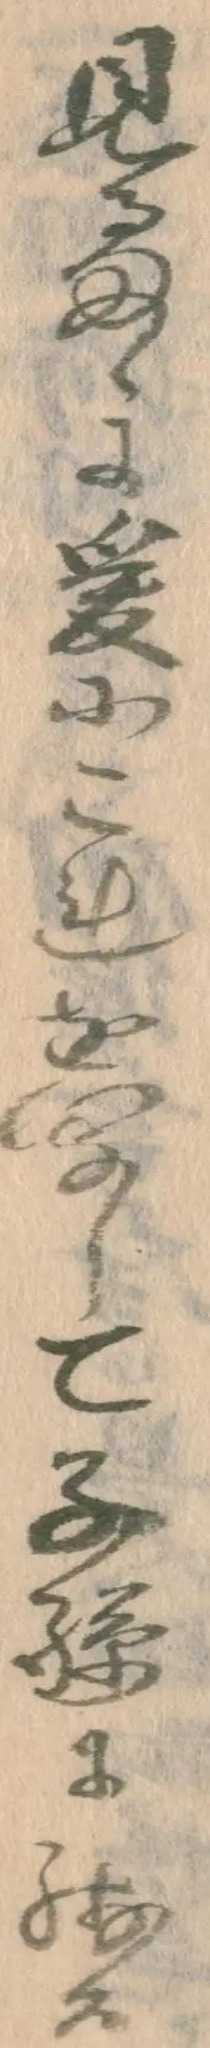見るまゝに爰にこれを写して子孫に残ス
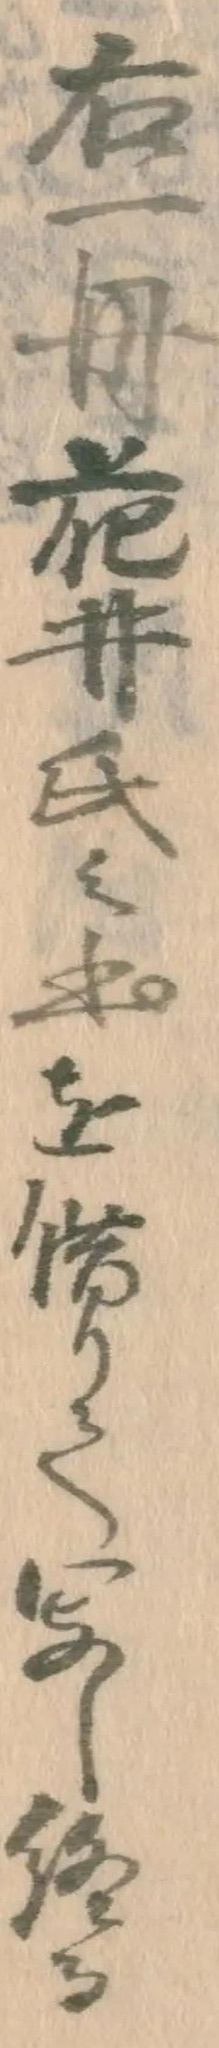右一冊花井氏之書を借りて写し終る
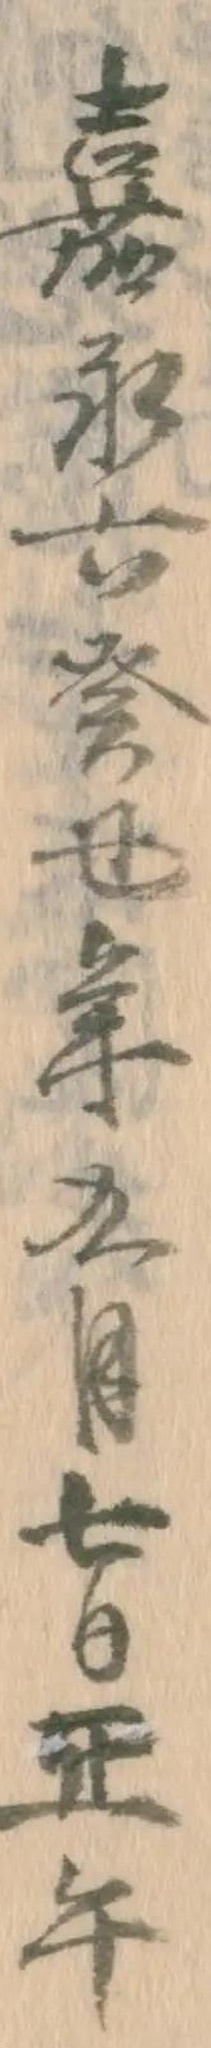嘉永六癸丑年九月七日正午三園
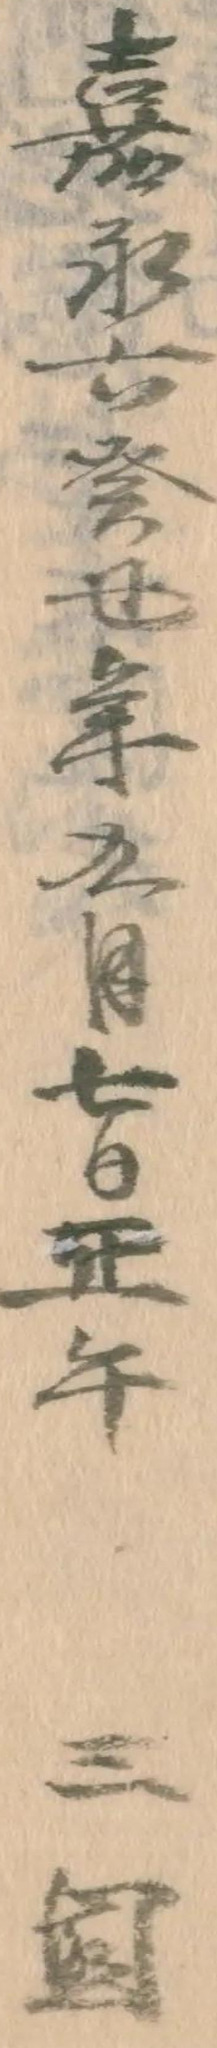嘉永六癸丑年九月七日正午三園
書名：信州大地震之記
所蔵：国立国会図書館 National Diet Library, JAPAN
